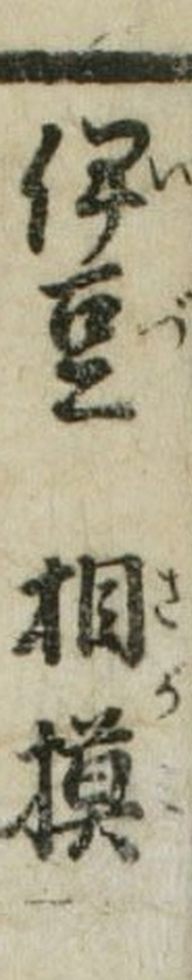伊豆相模
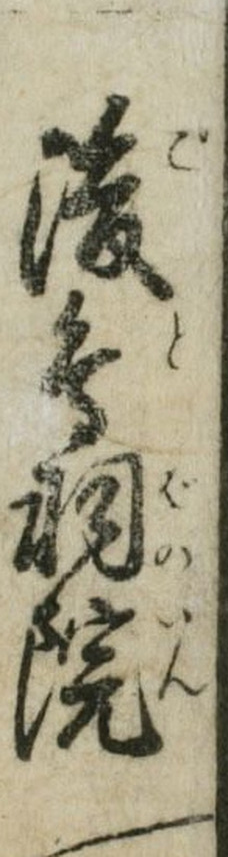後鳥羽院
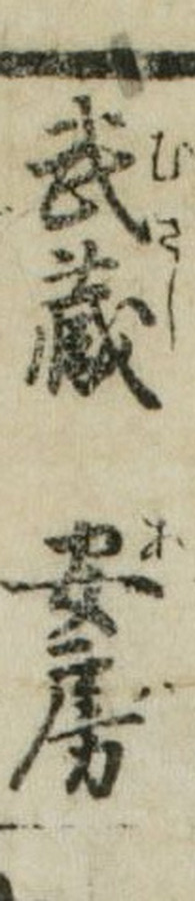武蔵安房
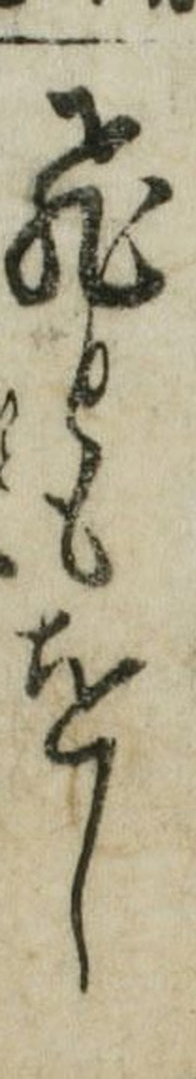ひともをし
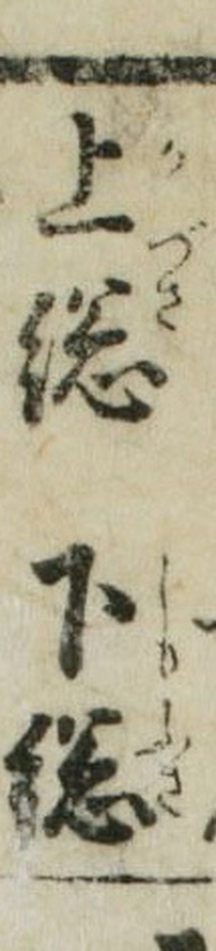上総下総
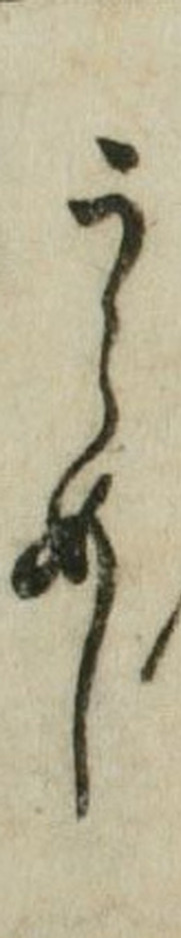うらめし
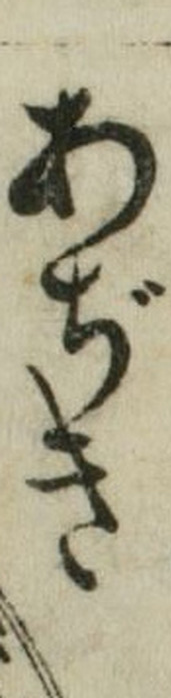あぢき
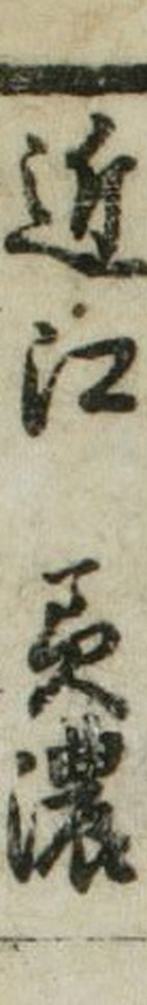近江美濃
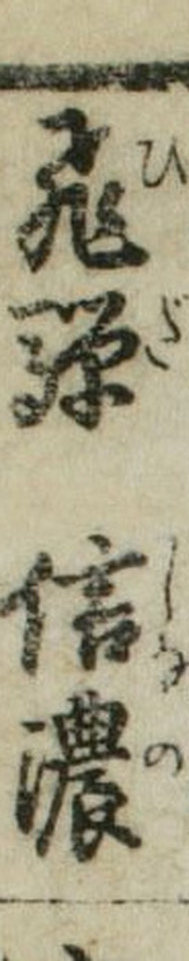飛騨信濃
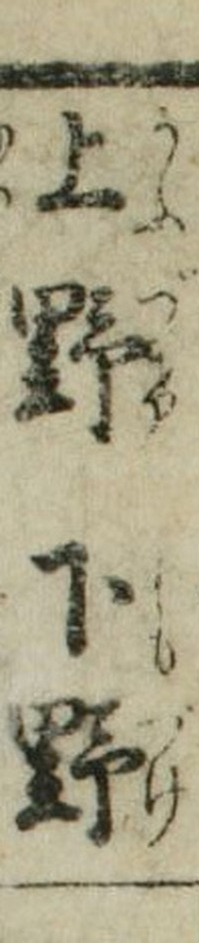上野下野
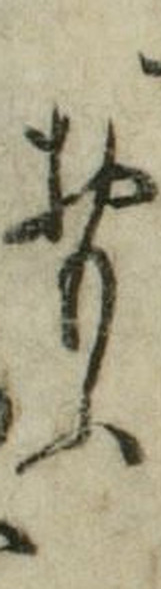おもふ
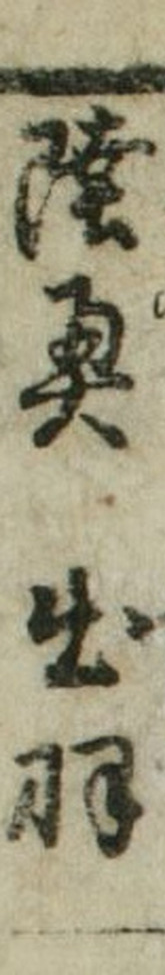陸奥出羽
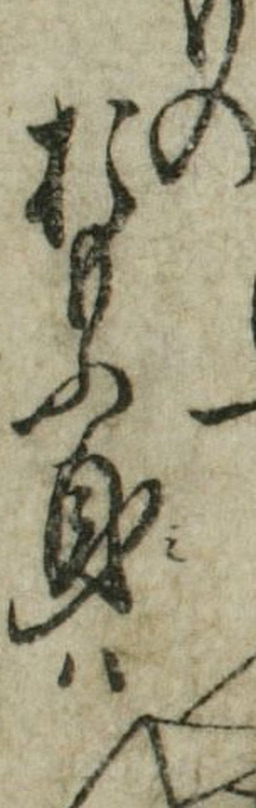おもふ身は

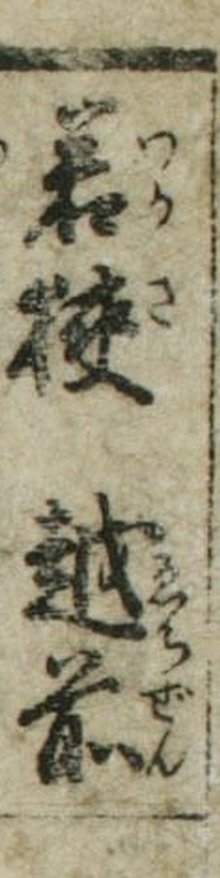若狭越前
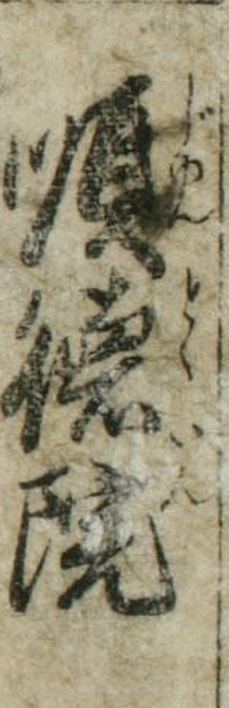順徳院
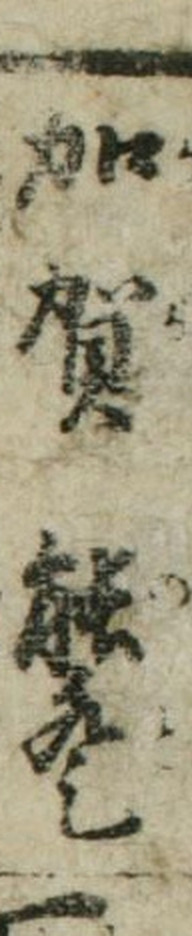加賀能登
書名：百人一首
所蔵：東京学芸大学教育コンテンツアーカイブ
